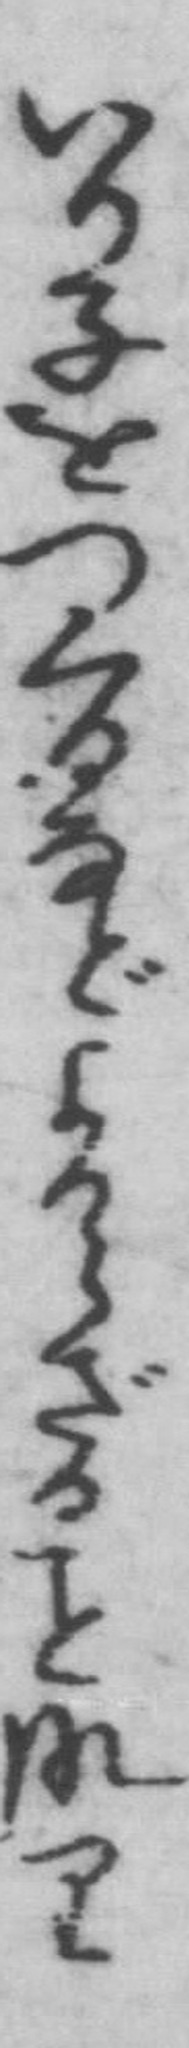いり子をつくるなどよからざる也
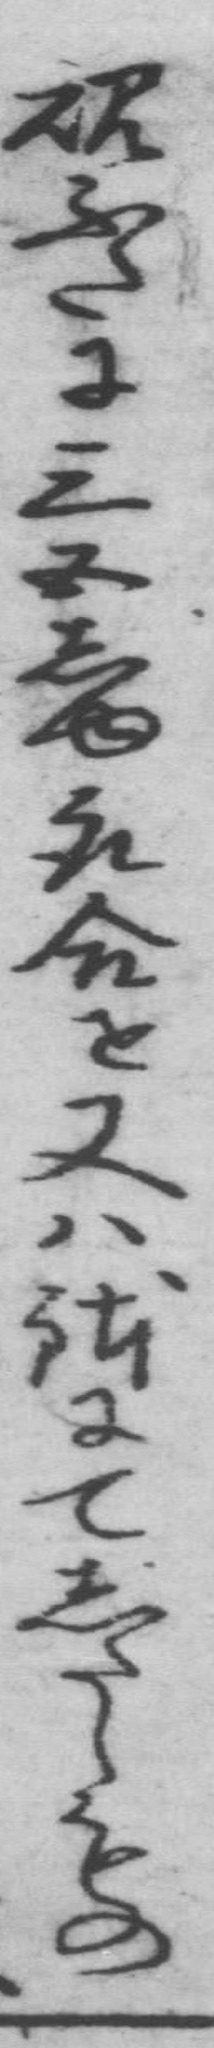硯ふたに三五しや取合を又はにてしたしもの
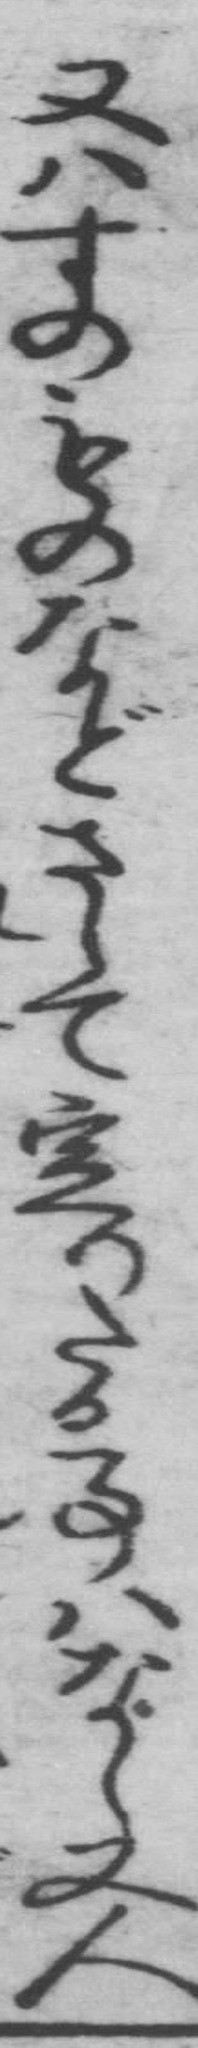又はすのものなどさしてりたるハなし又人
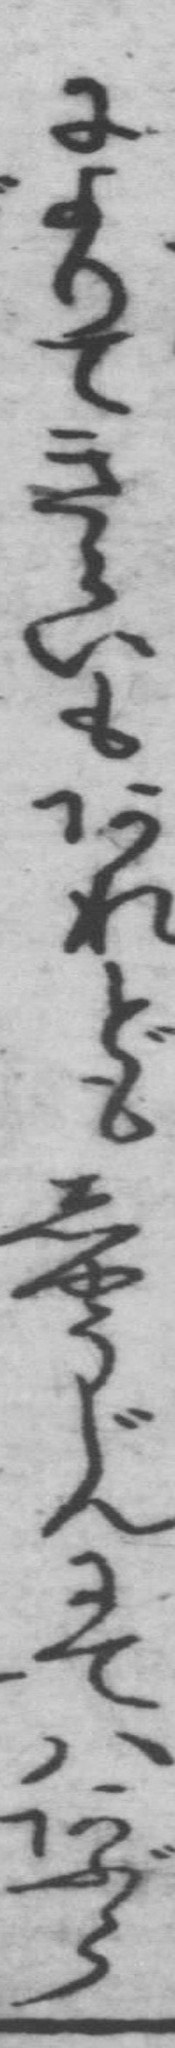によりていもあれどもしやうじんにてハあぶら
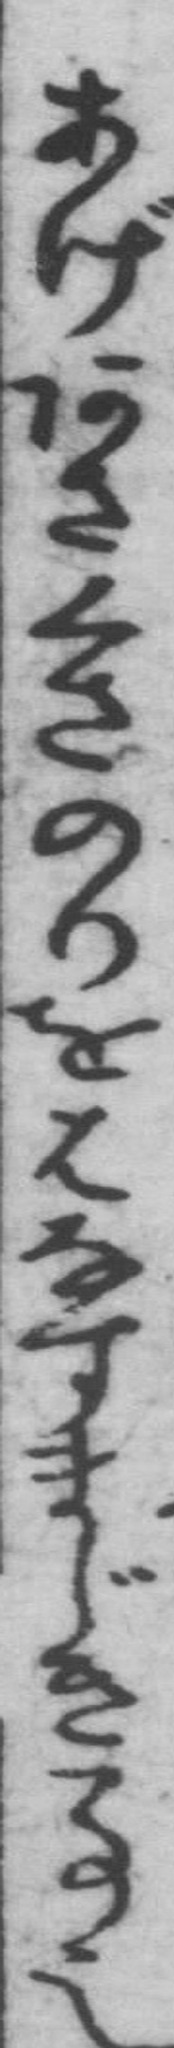あげあさくさのりをはなすまじき也
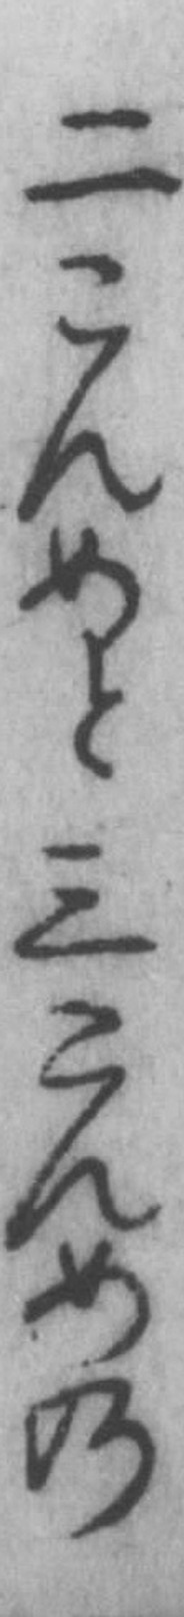二こんめと三こんめの
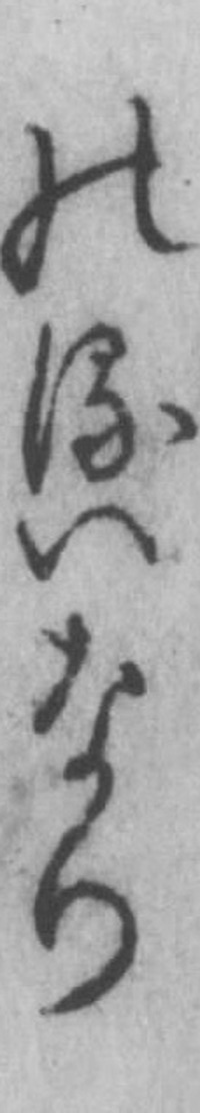のるいなり
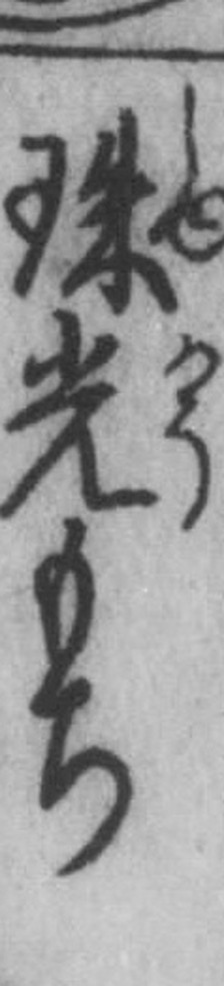珠光もち
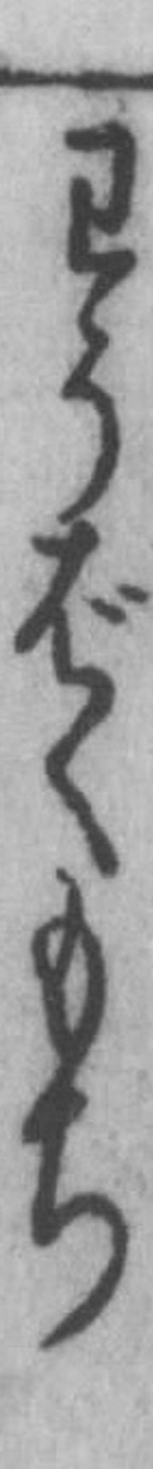わうばくもち
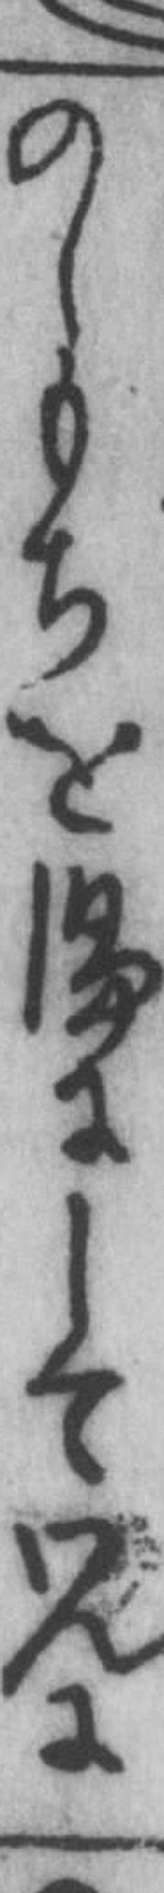のしもちをゆにしてワんに
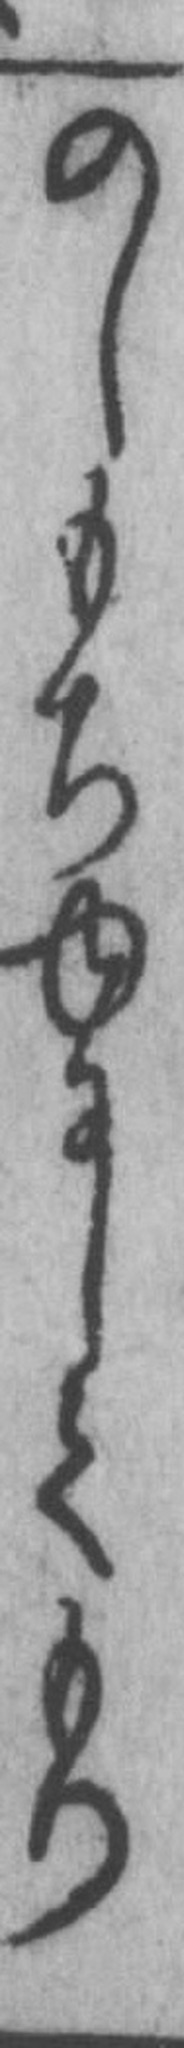のしもちをゆにしてもり
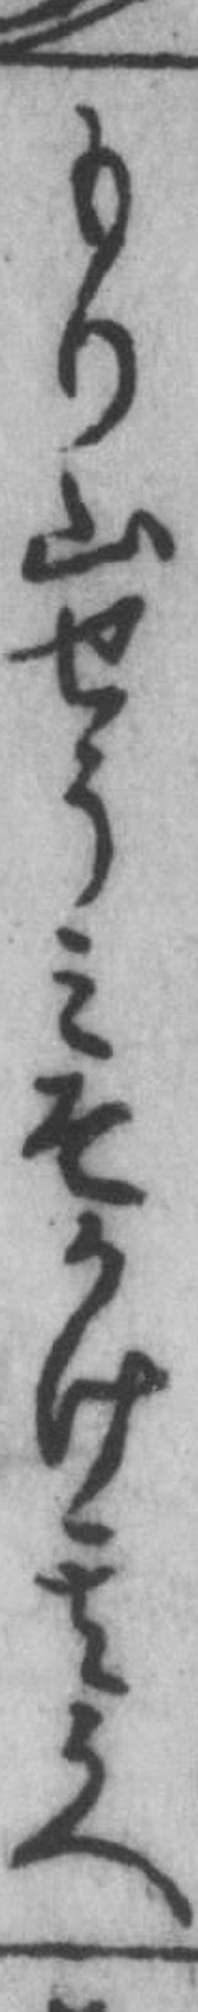もり三せうミそかけ其のうへ
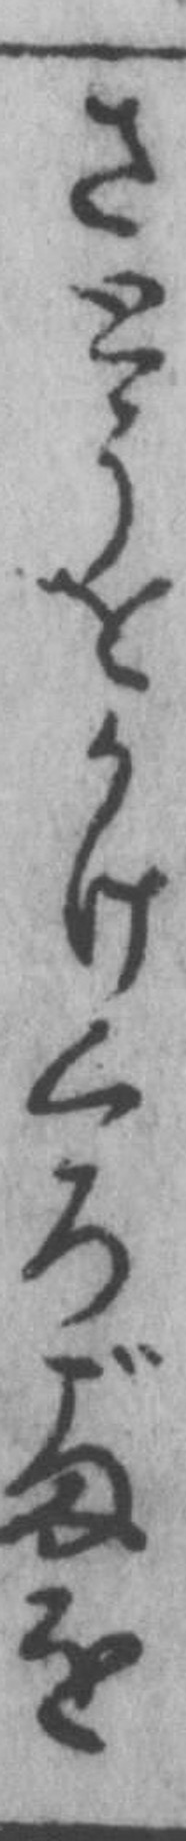さとうをかけくろごまを
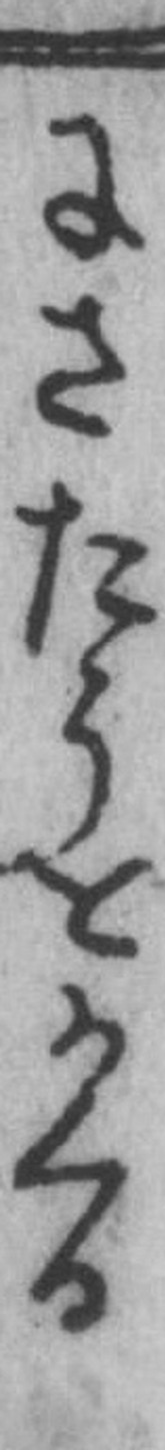さたうをかくる
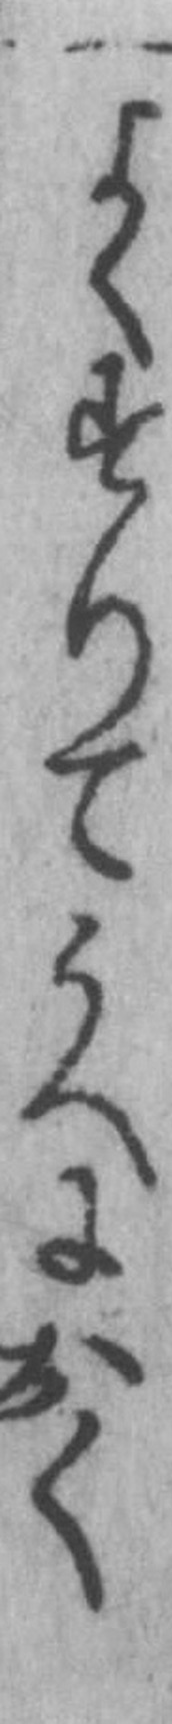よくすりてうへにおく
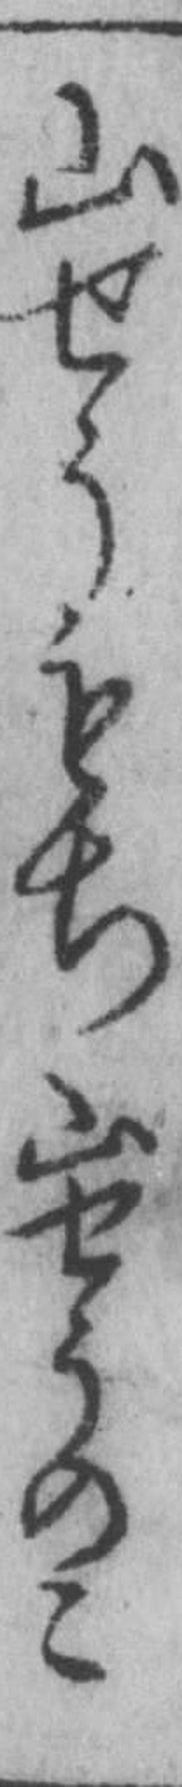山せうもち山せうのこ
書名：料理献立抄
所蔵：大阪府立大学学術情報センター 国文学研究資料館
